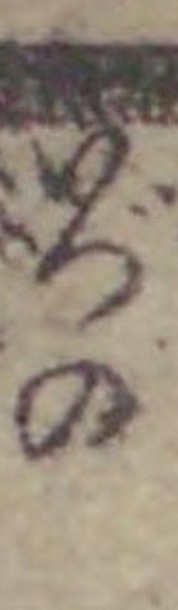いづの
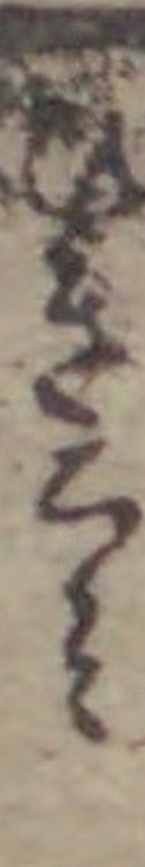ひきこみ
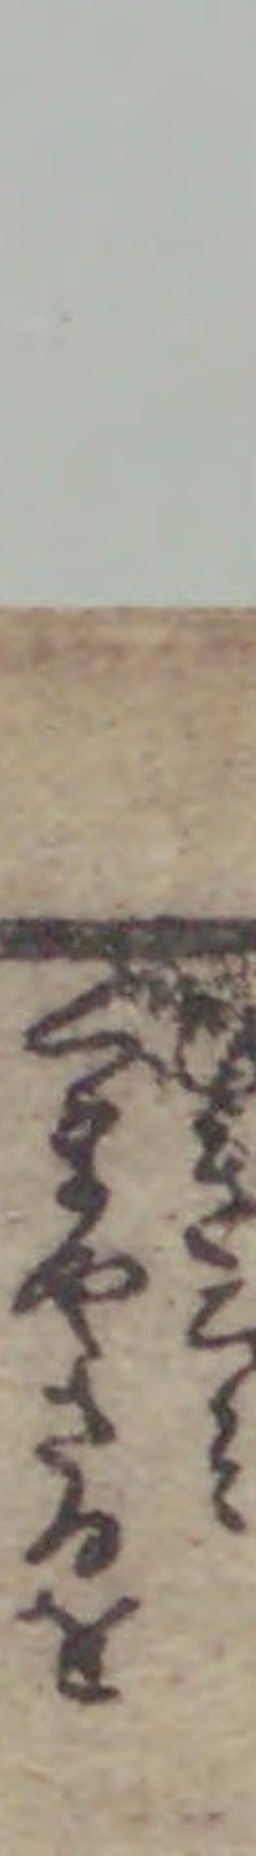くまやさるを
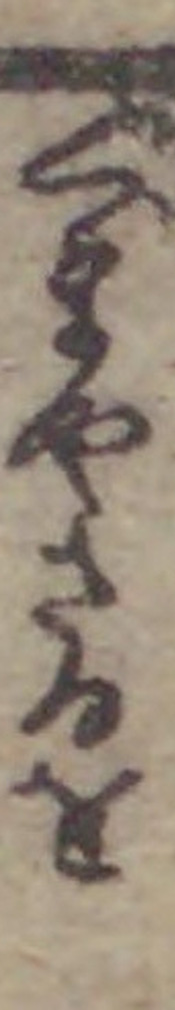くまやさるを
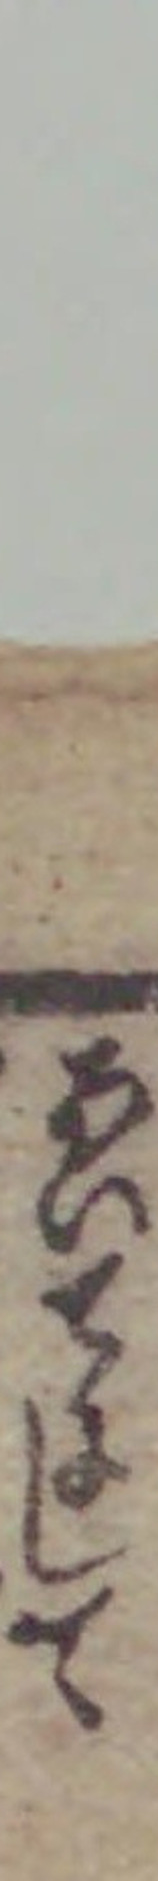あいてにして
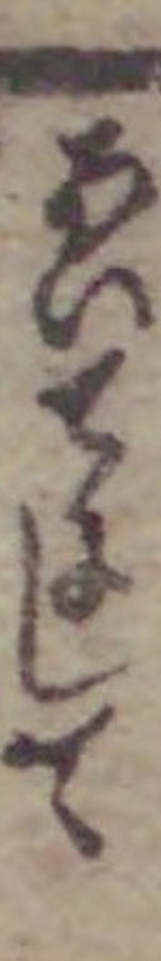あいてにして
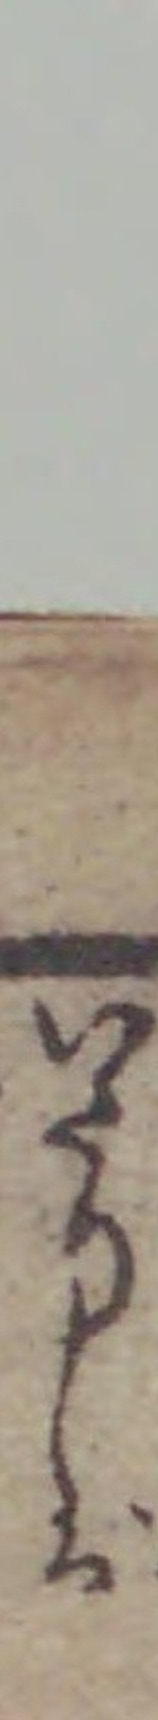いたりしが
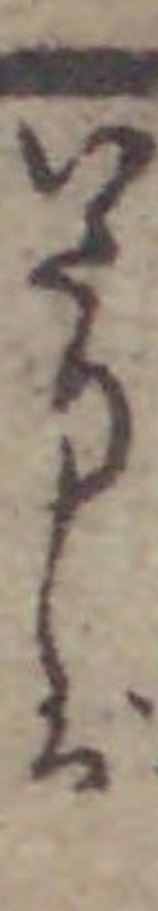いたりしが
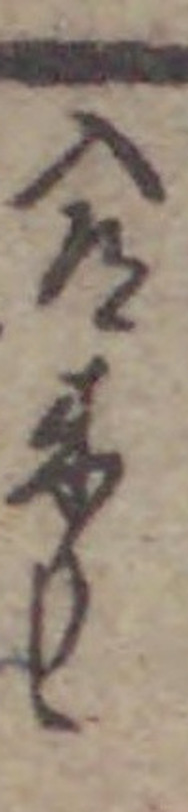入道来りし
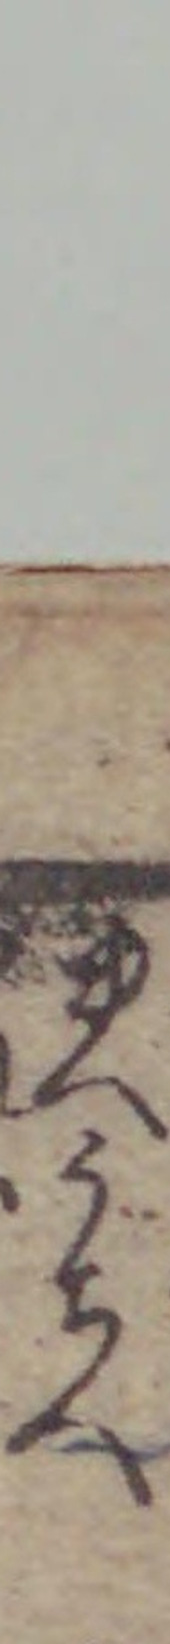ゆへうちへ
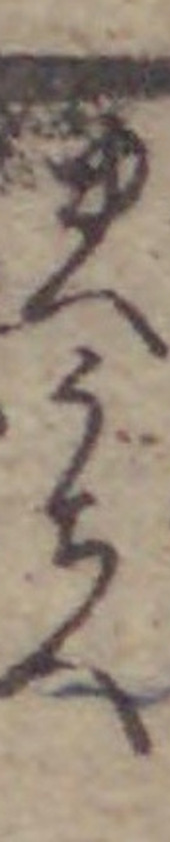ゆへうちへ
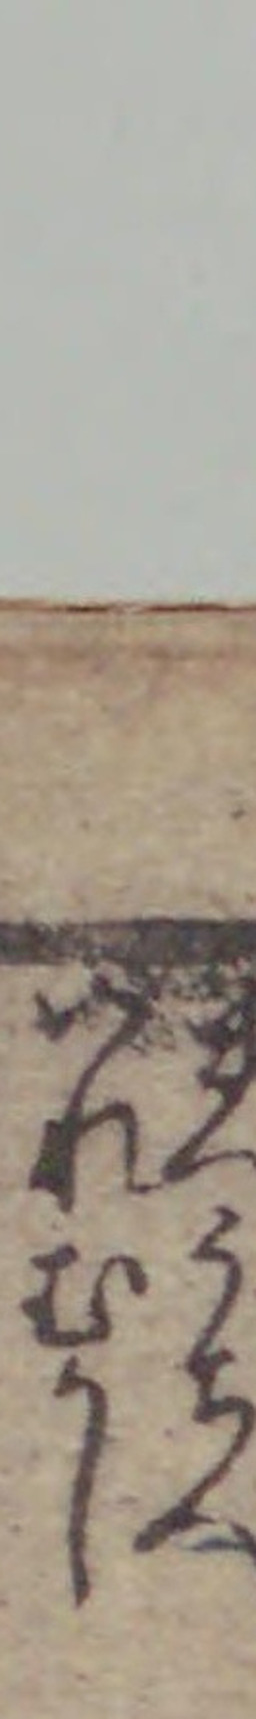いれむかし
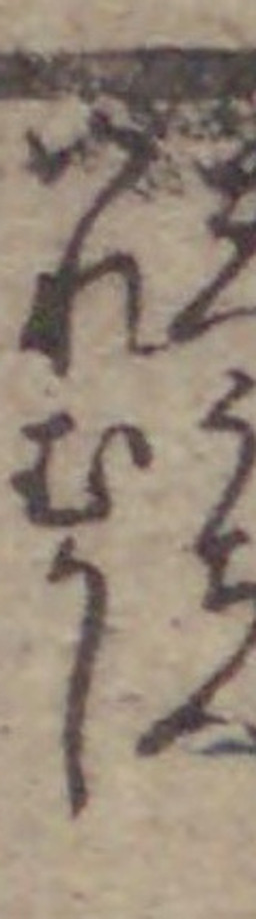いれむかし
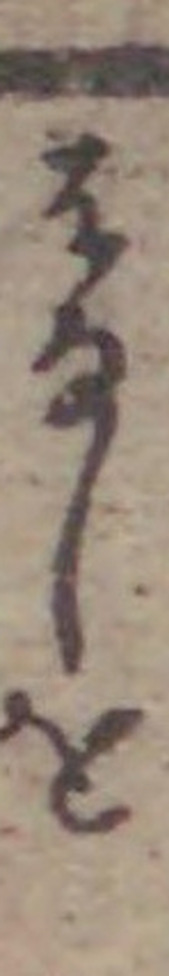はなしを
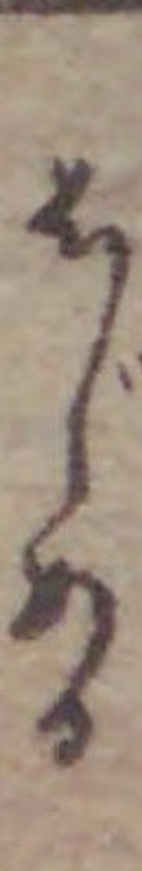はじめる

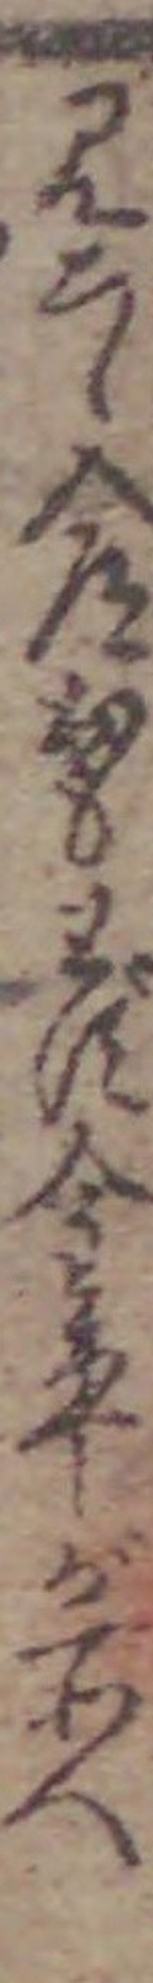みこし入道おもわず金平が所へ
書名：化物鼻がひしげ 2巻
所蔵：国立国会図書館 National Diet Library, JAPAN
